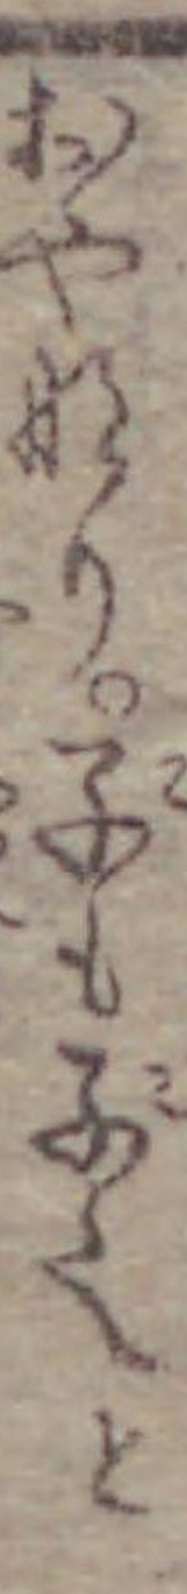おやなり。子も子也と
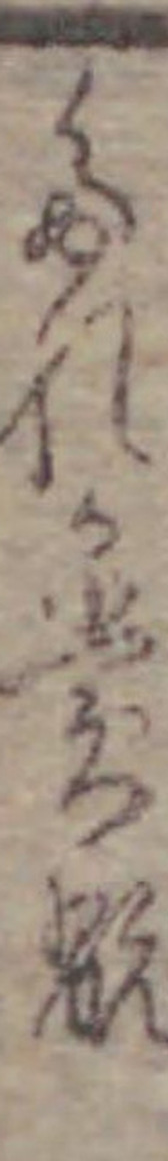たれか賞翫
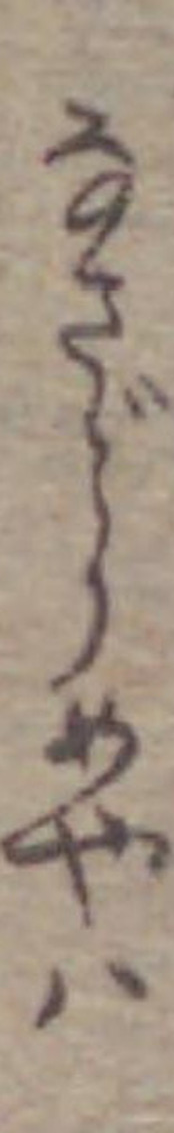なさゞらめやは
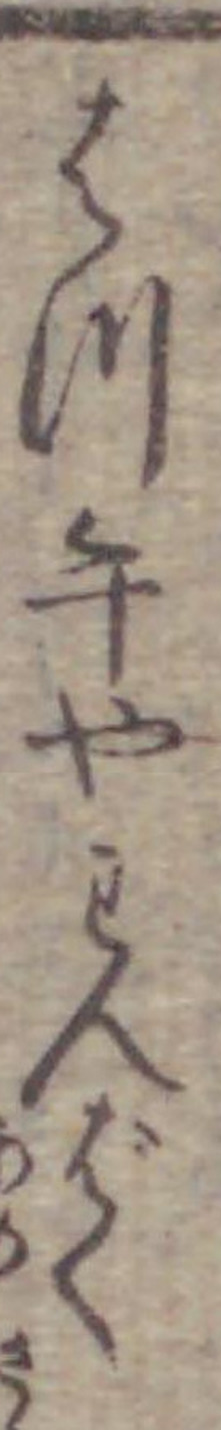はつ午やわんばく
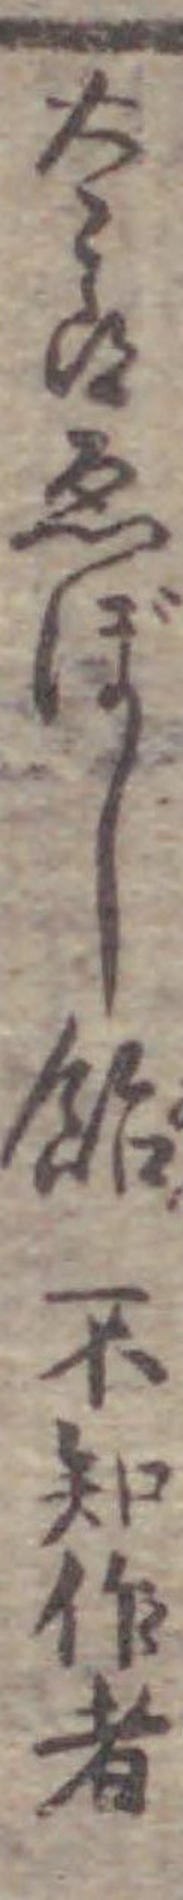太郎ゑぼし飴不知作者
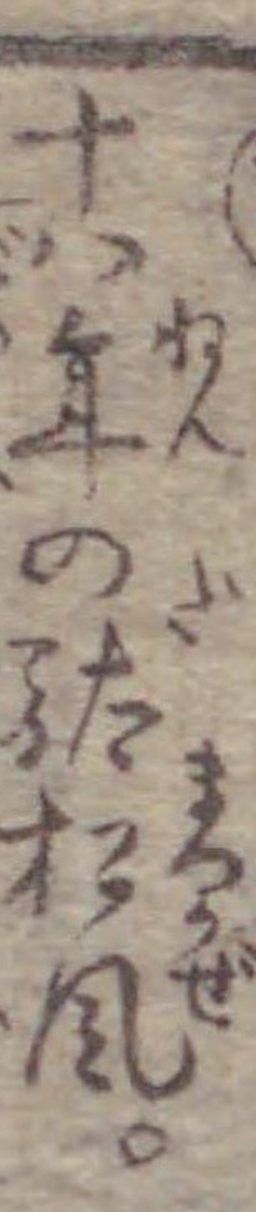十は年の駄松風。
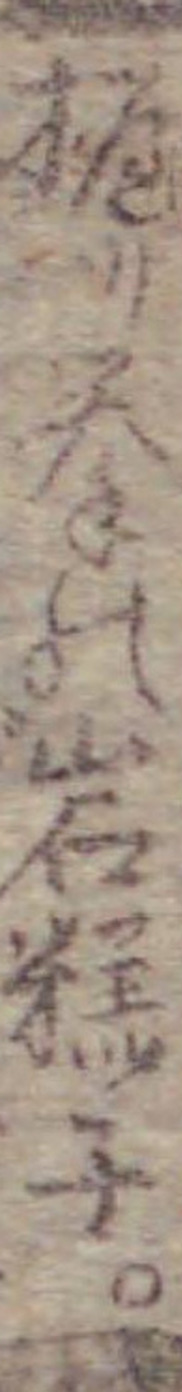握り拳の岩糕子。
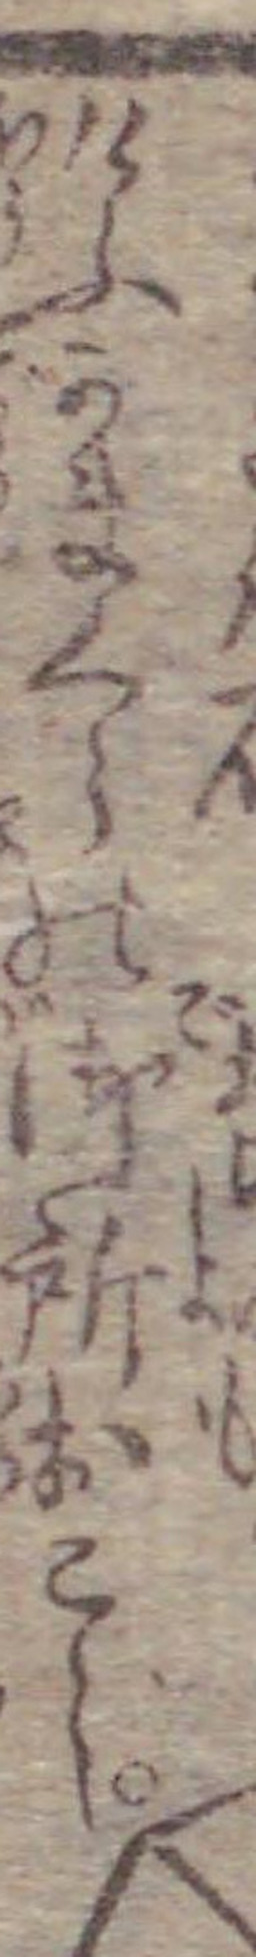けふのまくらの御所おこし。
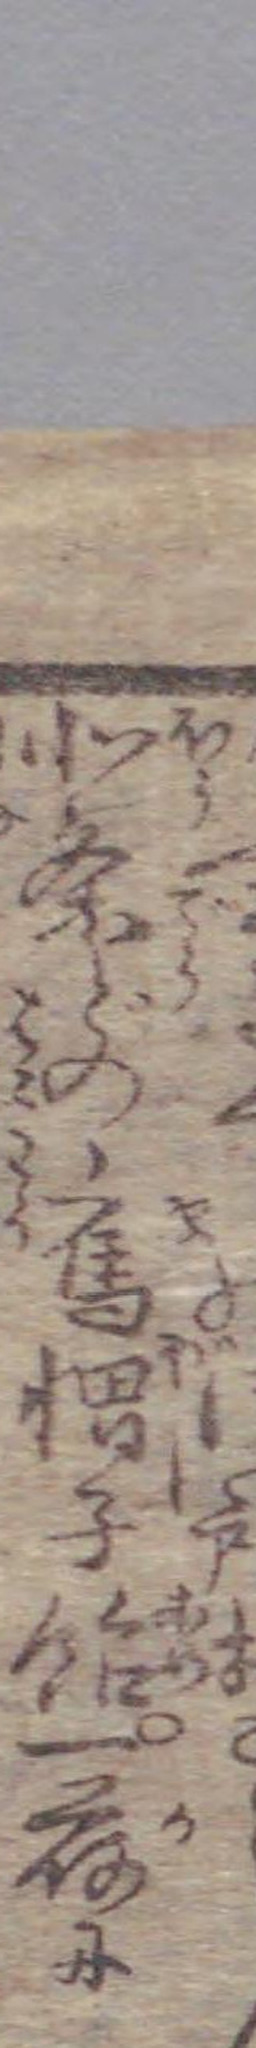北条どの烏帽子飴。一荷に
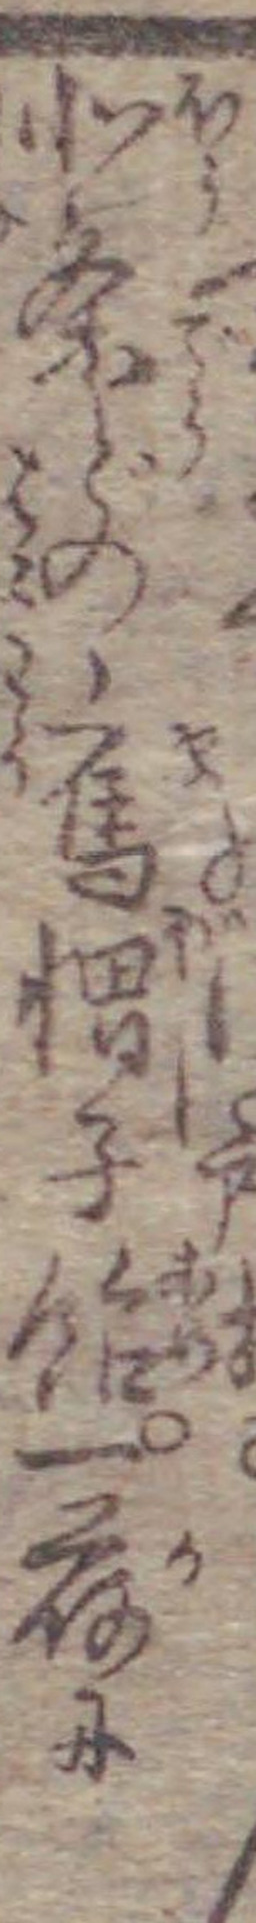北条どの烏帽子飴。一荷に
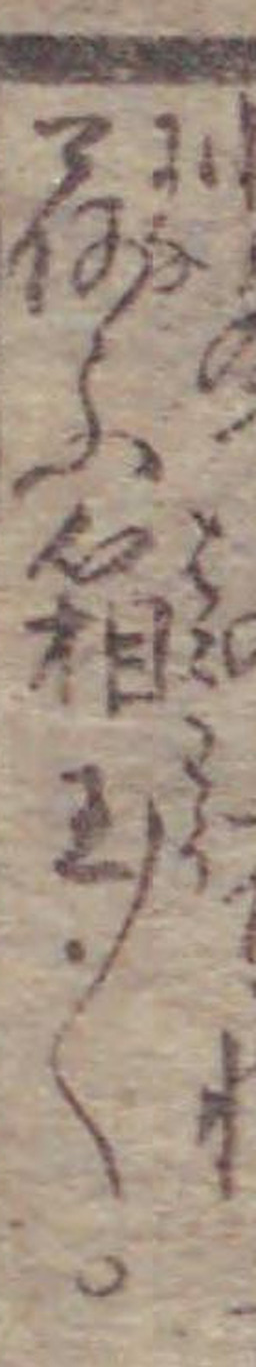荷ふ箱王〳〵。

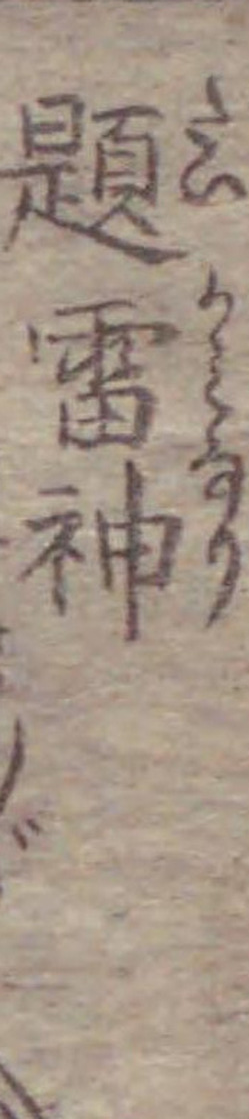題雷神
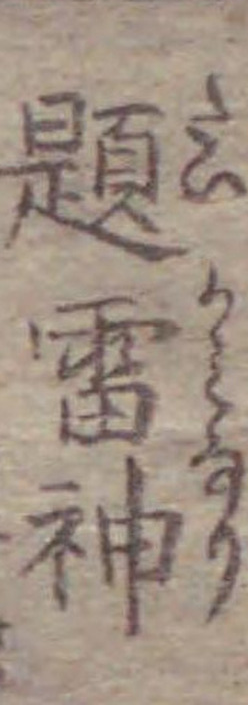題雷神
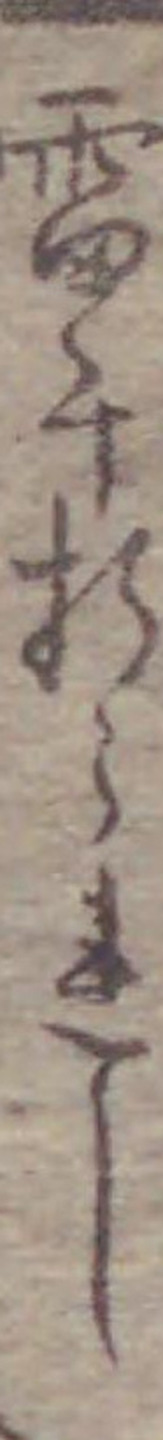雷に折られし
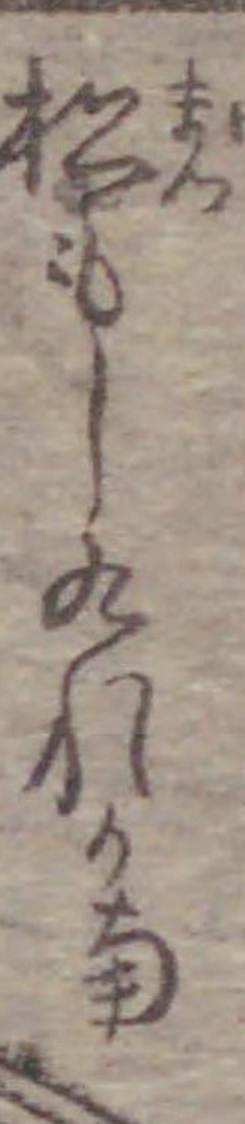松もしくれかな
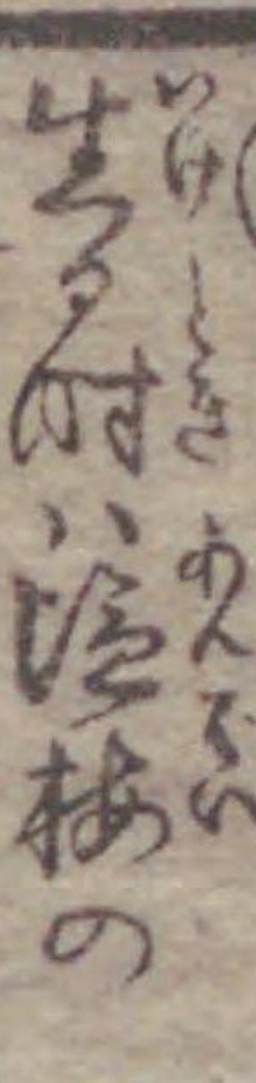生る時は塩梅の
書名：武者合天狗俳諧 : 2巻
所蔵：国立国会図書館 National Diet Library, JAPAN
